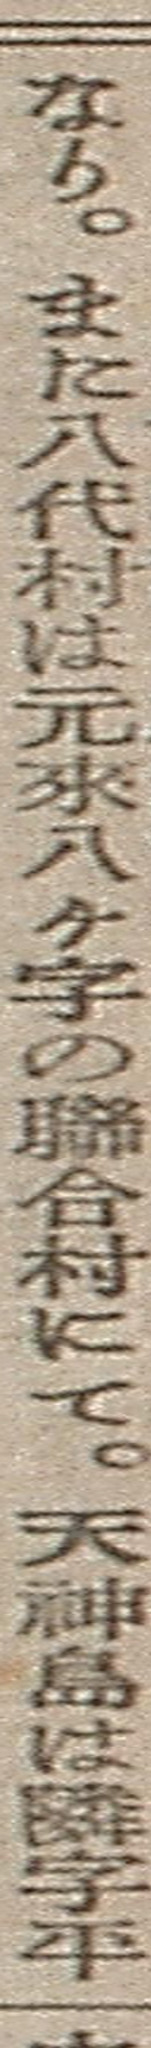なり。また八代村は元来八ケ字の連合村にて。天神島は隣字平
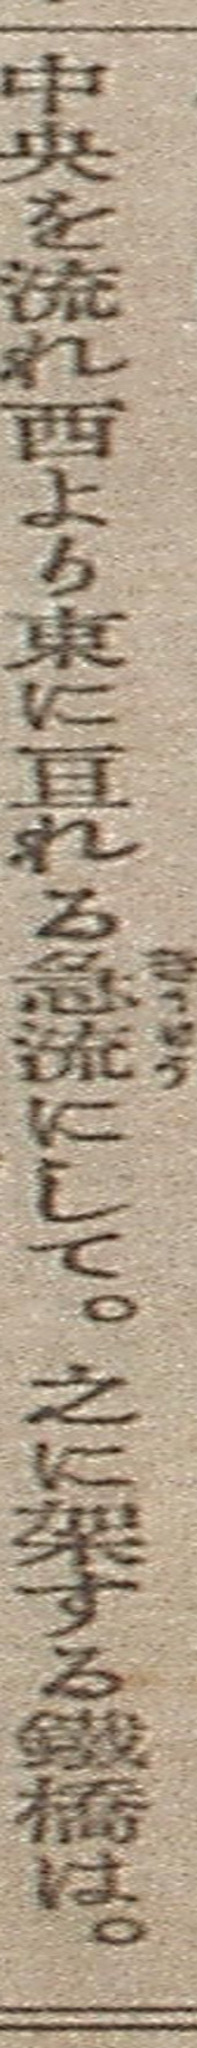中央を流れ西より東に亘れる急流にして。之に架する鉄橋は。
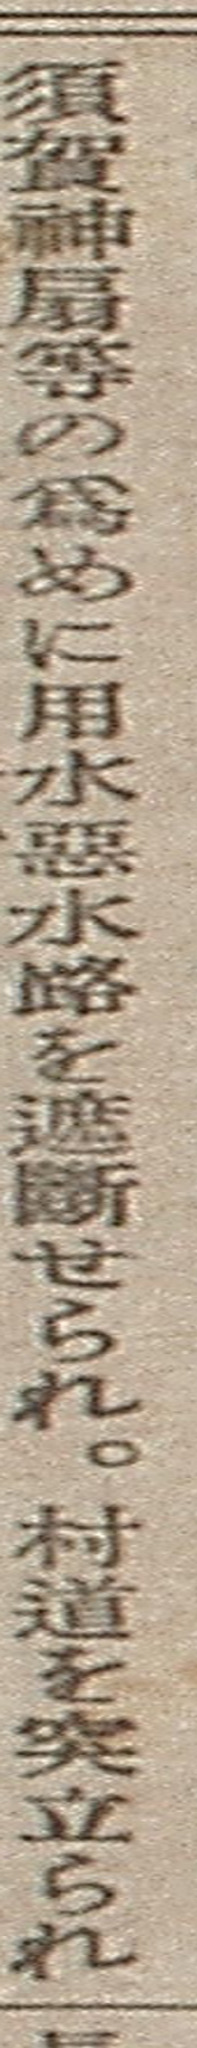須賀神扇等の為めに用水悪水路を遮断せられ。村道を突立られ
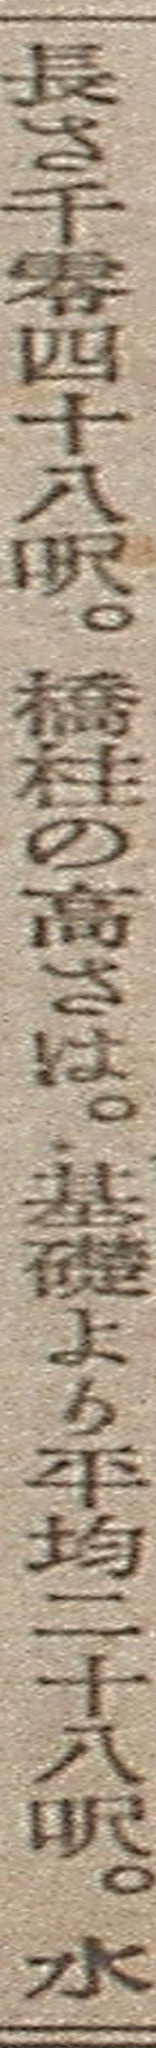長さ千零四十八呎。橋柱の高さは。基礎より平均二十八呎。水
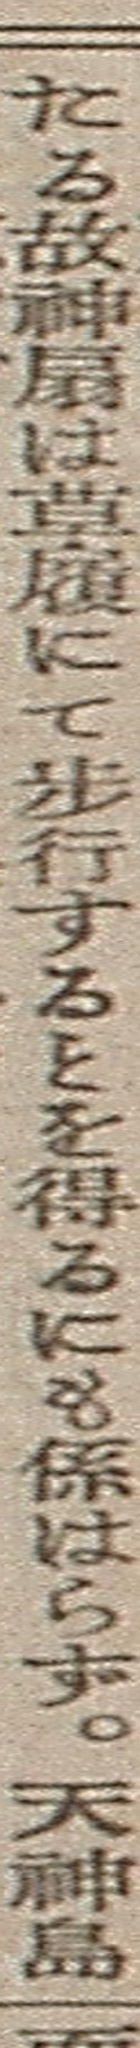たる故神扇は草履にて歩行することを得るにも係はらず。天神島
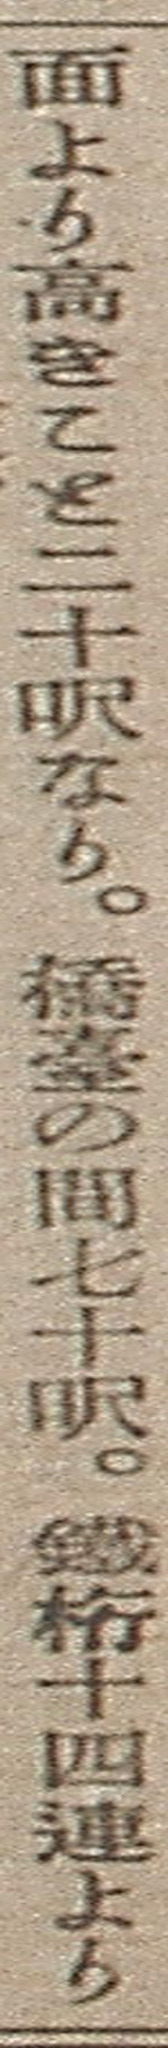面より高きこと二十呎なり。橋台の間七十呎。鉄桁十四連より
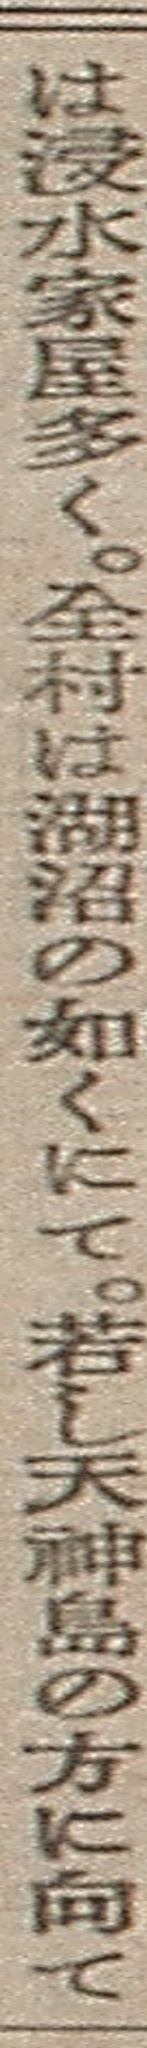は浸水家屋多く。全村は湖沼の如くにて。若し天神島の方に向て
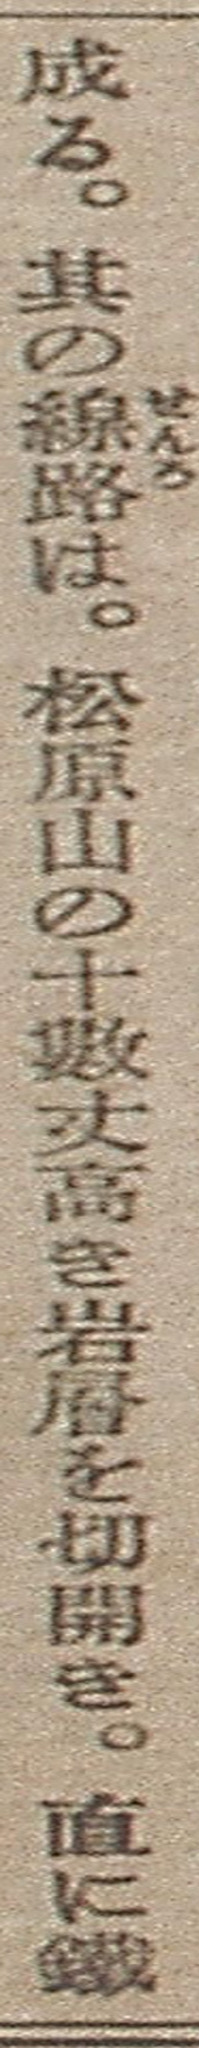成る。其の線路は。松原山の十数丈高き岩層を切開き。直に鉄

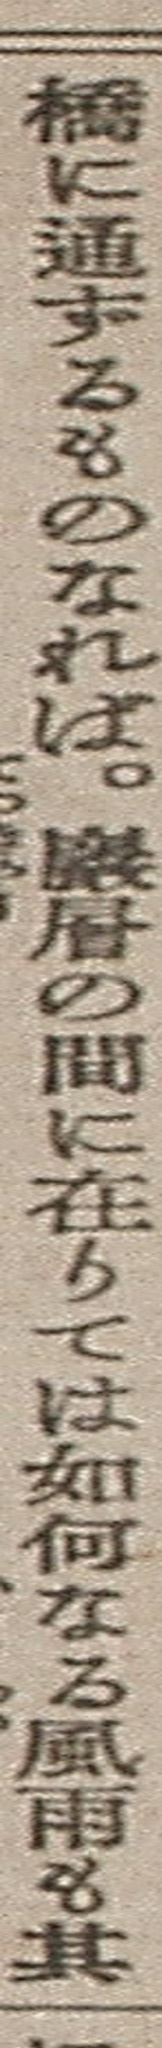橋に通ずるものなれば。巌層の間に在りては如何なる風雨も其
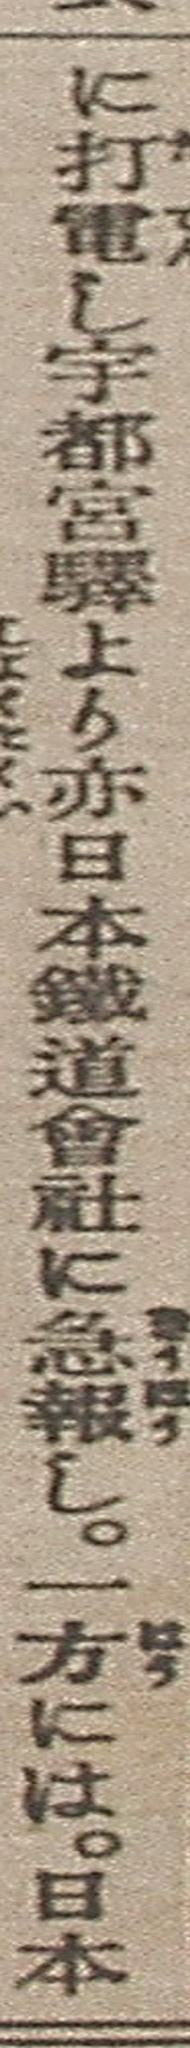に打電し宇都宮駅より亦日本鉄道会社に急報し。一方には。日本
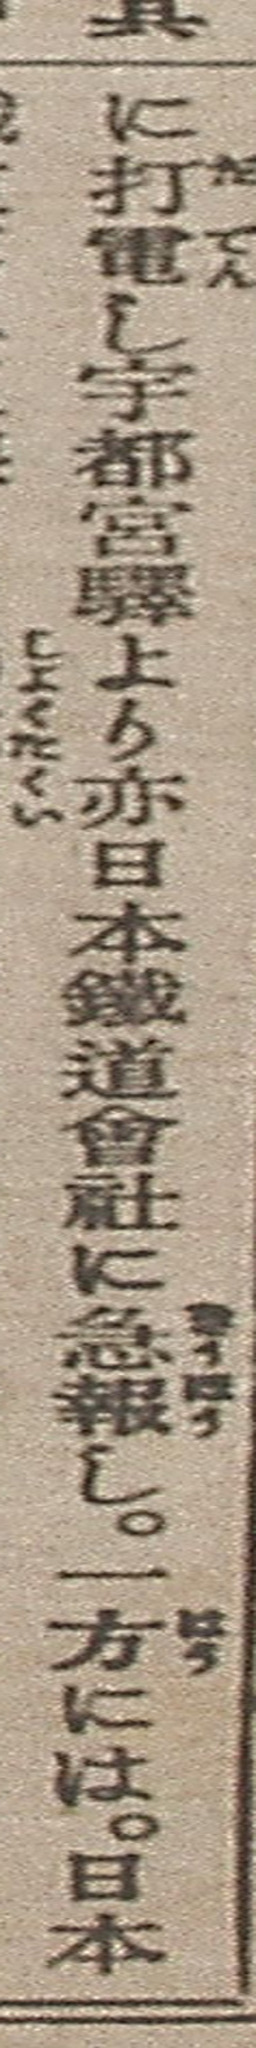に打電し宇都宮駅より亦日本鉄道会社に急報し。一方には。日本
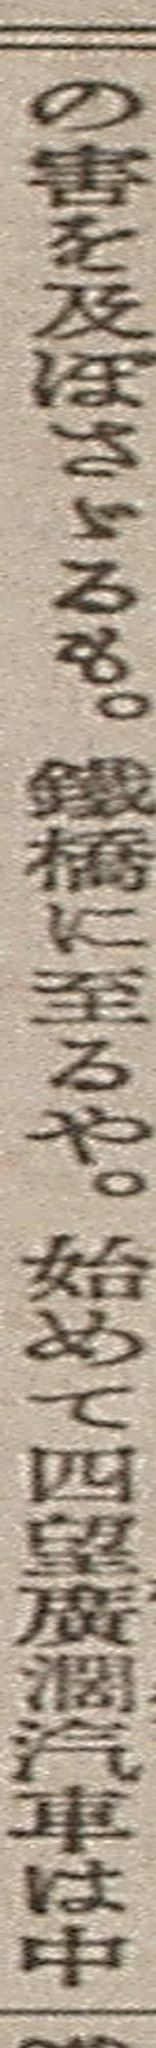の害を及ぼさゞるも。鉄橋に至るや。始めて四望広濶汽車は中
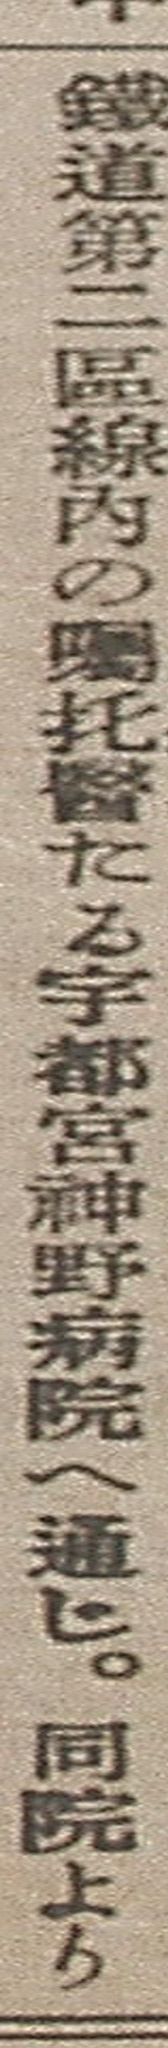鉄道第二区線内の嘱託医たる宇都宮神野病院へ通じ。同院より
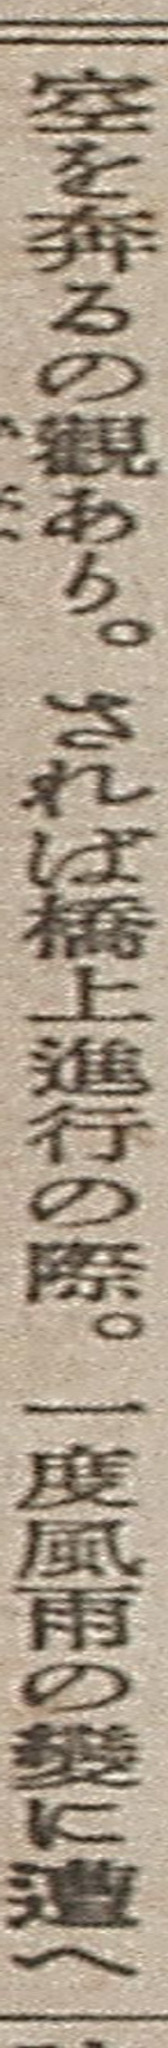空を奔るの観あり。されば橋上進行の際。一度風雨の変に遭へ
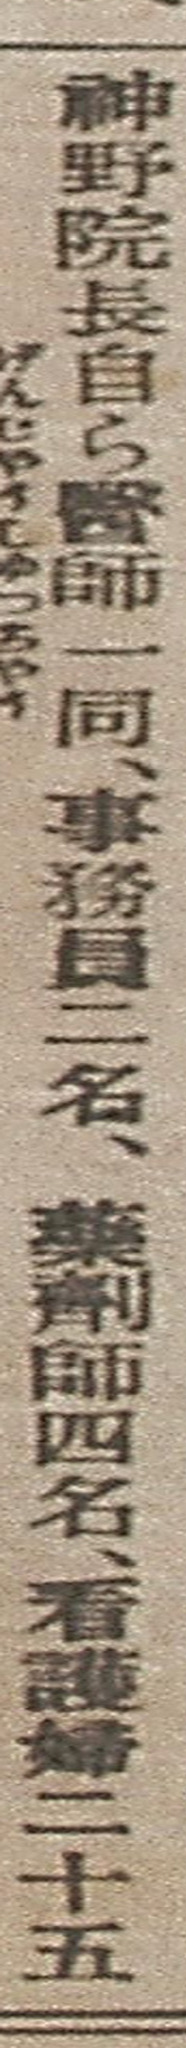神野院長自ら医師一同、事務員二名、薬剤師四名、看護婦二十五
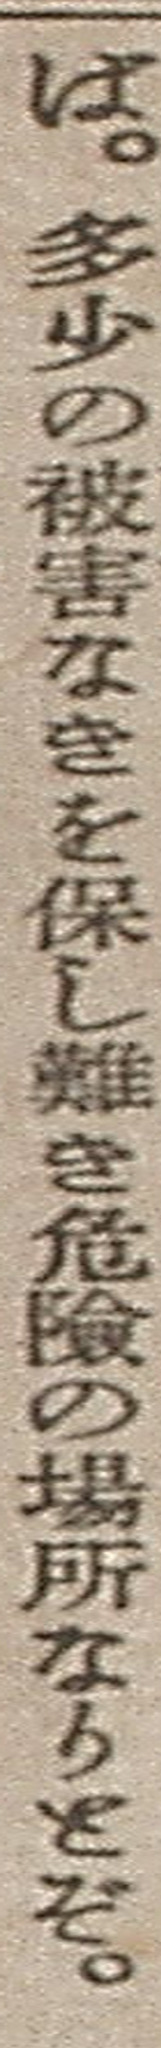ば。多少の被害なきを保し難き危険の場所なりとぞ。
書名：風俗畫報臨時増刊第百九十九號　明治三十二年十月各地災害圖會（前編之續）
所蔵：東京大学地震研究所図書室 Earthquake Research Institute Library, The University of Tokyo, JAPAN
